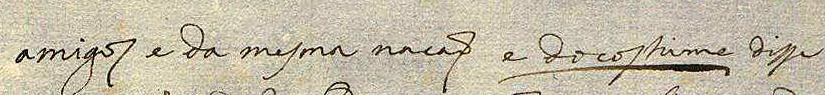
amigos e da mesma naçaõ e do costume disse
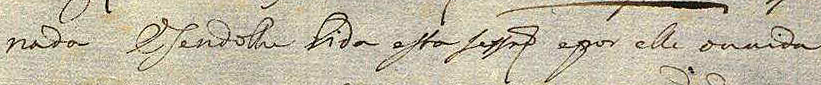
nada E sendolhe lida esta sessaõ e por elle ouuida
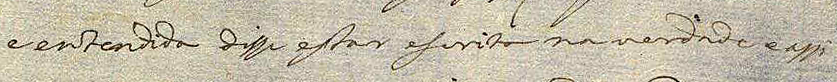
e entendida disse estar escrita na uerdade e assi
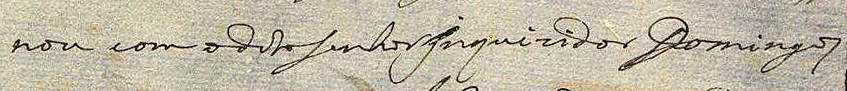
nou com o dito senhor jnquizidor Domingos
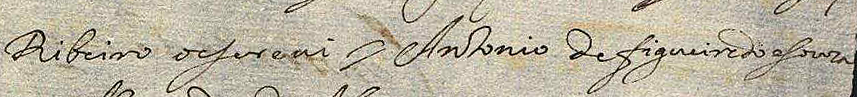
Ribeiro o escreui // Antonio de figueiredo souza
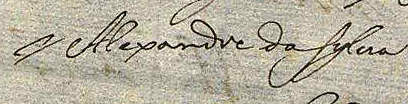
// Alexandre da sylua
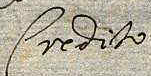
Credito
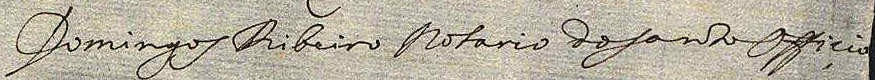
Domingos Ribeiro notario do santo Officio
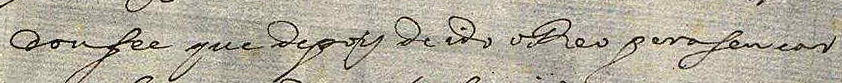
dou fee que depois de ido o Reo pera seu car
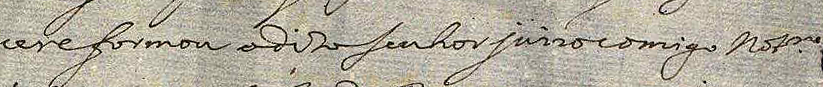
cere formou o dito senhor juizo comigo not.ro
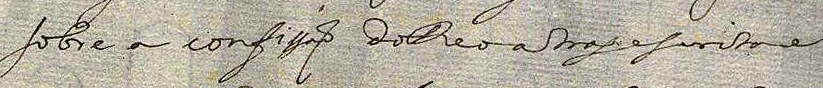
sobre a confissaõ do Reo atras escrita e
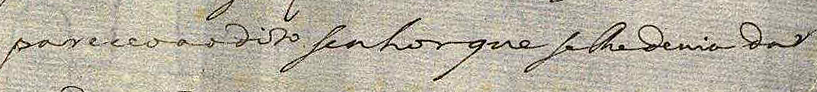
pareceo ao dito senhor que se lhe deuia dar
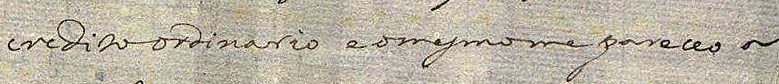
credito ordinario e o mesmo me pareceo a
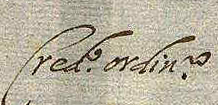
Cred.o ordin.ro
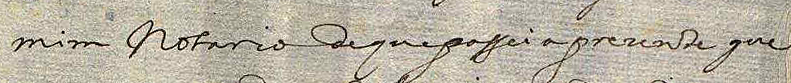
mim Notario de que passei a prezente que
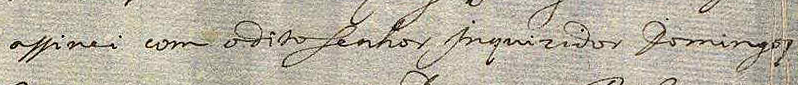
assinei com o dito senhor jnquizidor Domingos
